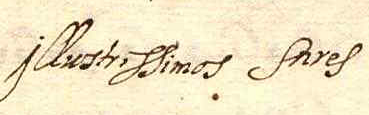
jllustrissimos Snres
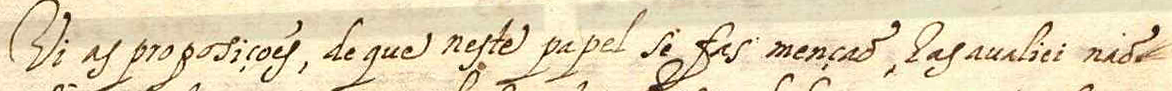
Vi as proposiçoẽs, de que neste papel se fas mençaõ, E as aualiei naõ
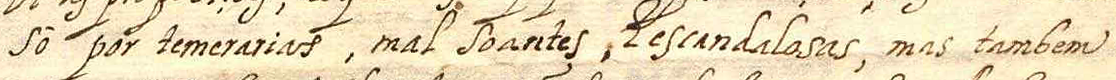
só por temerarias, mal soantes, escandalosas, mas tambem
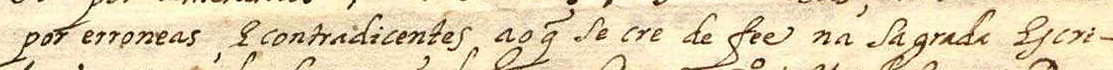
por erroneas, E contradicentes ao q̄ se cre de fee na Sagrada Escri
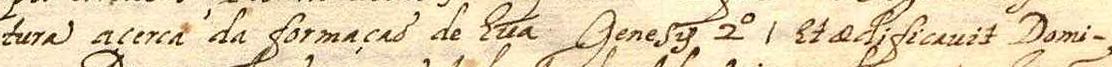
tura acerca da formaçaõ de hūa Genesis 2o / Et ædificauit Domi
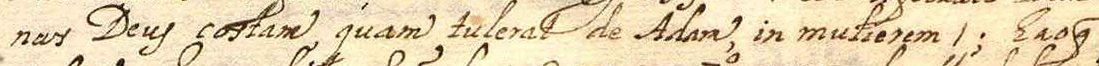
nus Deus costam, quam tulerat de Adam, in mulierem /; E ao q̄
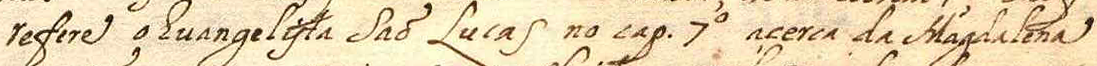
refere o Euangelista Saõ Lucas no cap. 7o acerca da Magdalena
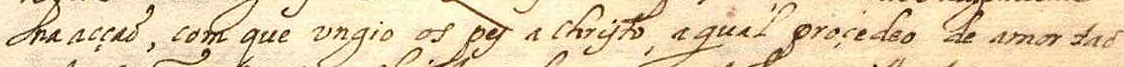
na acçaõ, com que vngio os pes a christo, a qual procedeo de amor taõ
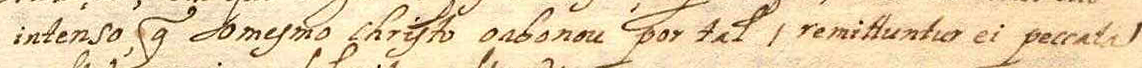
intenso, q̄ o mesmo christo o abonou por tal / remittuntur ei peccata
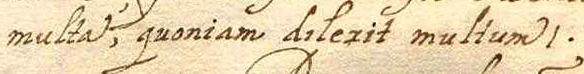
multa, quoniam dilexit multum /.
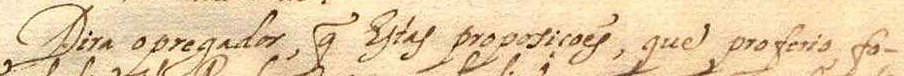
Dira o pregador, q̄ Estas proposiçoẽs, que proferio, fo
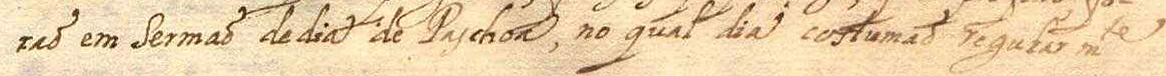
raõ em Sermaõ de dia de Paschoa, no qual dia costumaõ regularmte
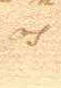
os
